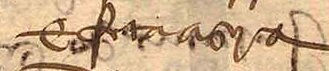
E feta asy a
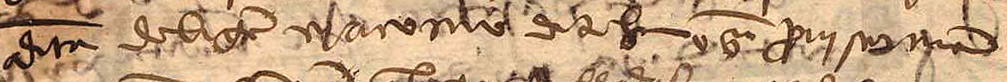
dita deligēcya como dito he o s̄r ꝓujsor mā
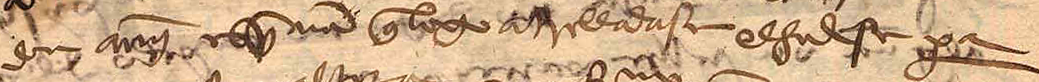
dou a mj̄ esp̄uā q̄ logo a trelladase e lhe dese ꝑa
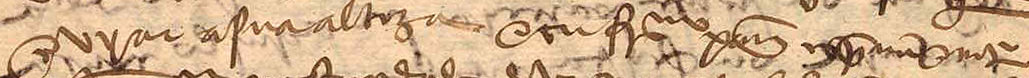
ēvyar a sua alteza e eu frco pāiz esp̄uā e noto
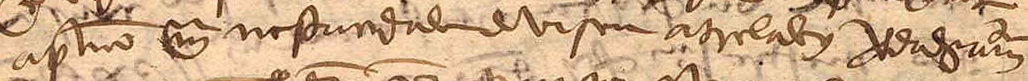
aplīco mor nesta cydade de viseu a treladey ꝟdadjramte
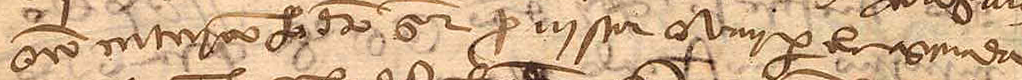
e c̄ocertey c̄o ho dt̄o s̄or ꝓujssor e vay p̄ ele asynada
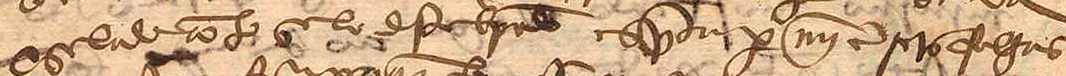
e selado c̄o ho selo deste bp̄ado esp̄ta ꝑ m̄j ē sejs folhas
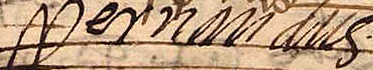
ffernandus
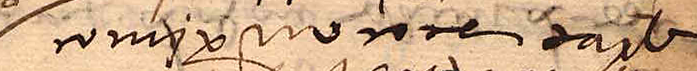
comjguo cōcertado
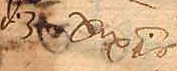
dez xix r̄s
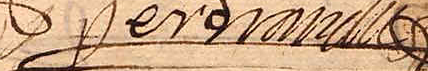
ffernandus
